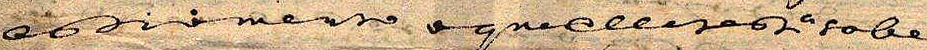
estromento o que elle testa sabe
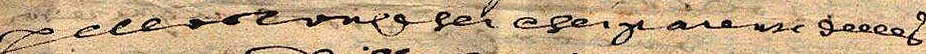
pellos conheser e ser parente delles
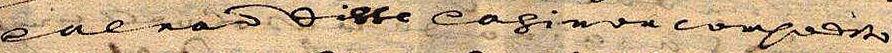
e al naõ disse e asinou com ho dito
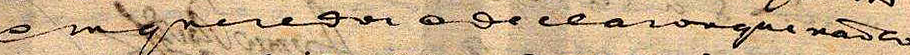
emqueredor e declarou que não co
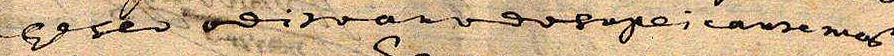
nheseo o dito auo do suplicante mas
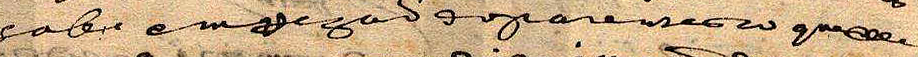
sabe em Rezaõ do parentesco que elle
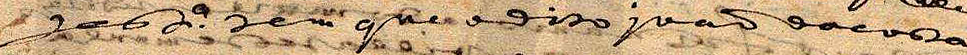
testa. tem que o dito joaõ da costa
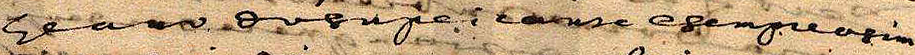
he auo do suplicante e sempre asim
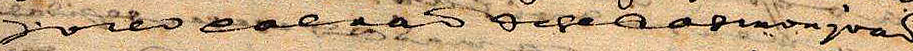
toreo e al naõ dise e asinou joaõ
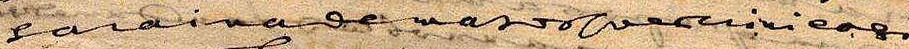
saraiua de matos ho escriui e asi
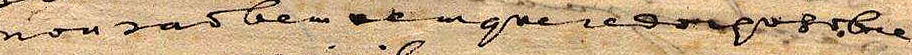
nou taõbem o emqueredor ho sobre
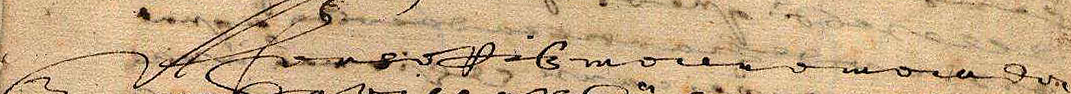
item Afonso Riz̄ moreno morador
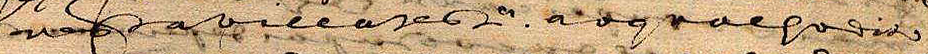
nesta villa testa. ao qual ho dito
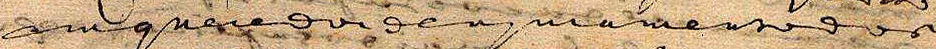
emqueredor deu juramento dos
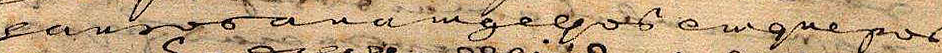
santos auangelhos em que pos
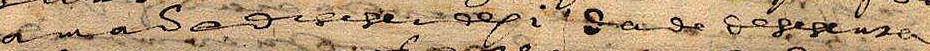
a maõ e dise ser de hidade de sesenta
